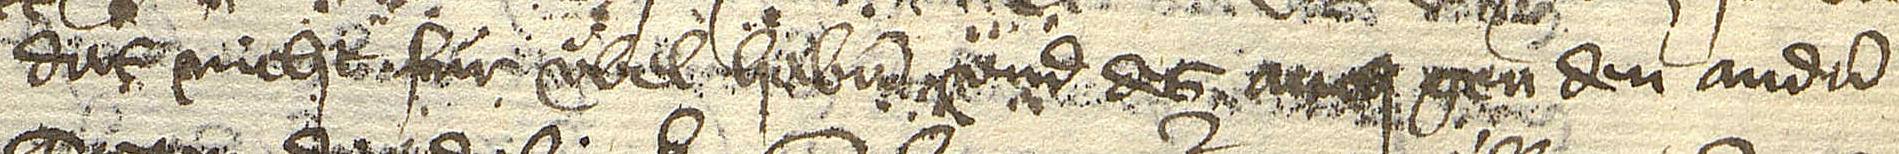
das nicht für v̈bel habn* vnd des auch gen den andn*
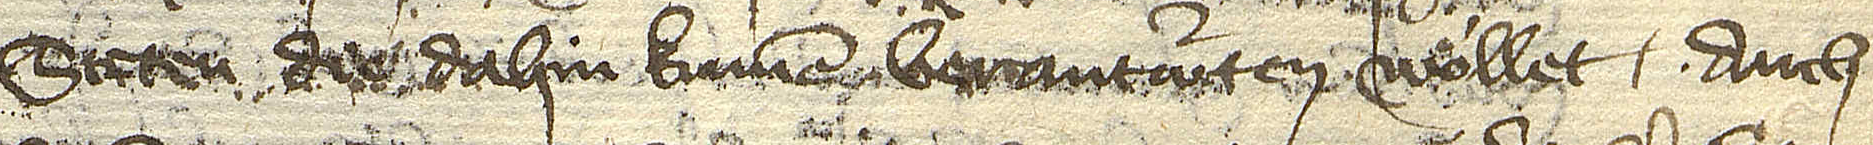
Steten die dahin kume* verantw*ten wöllet / . Auch
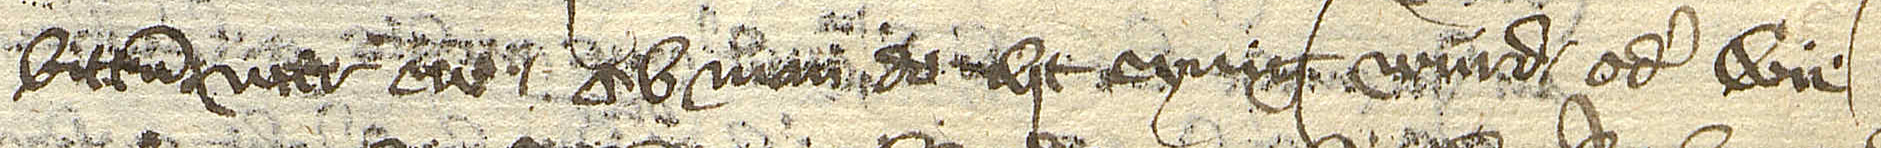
bittn* wir ew / . Ob man da iht eynig würd / od* wie
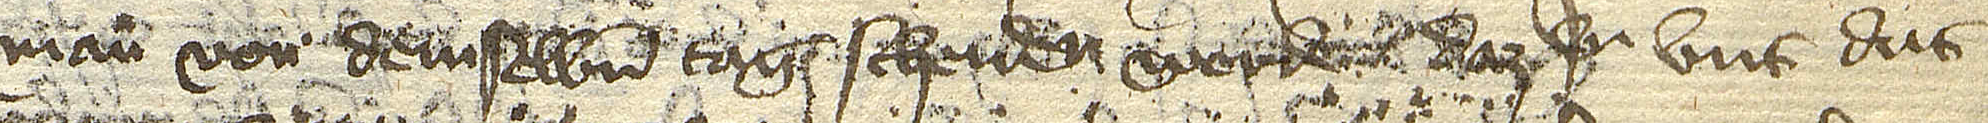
man von demſelbn* tag ſcheiden werde / daʒ Ir vns das
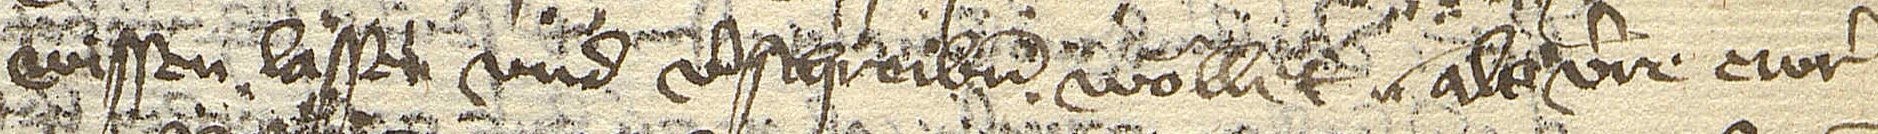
wiſſen laſſen vnd v*ſchreibn* wöllet / alsv*re ewr*
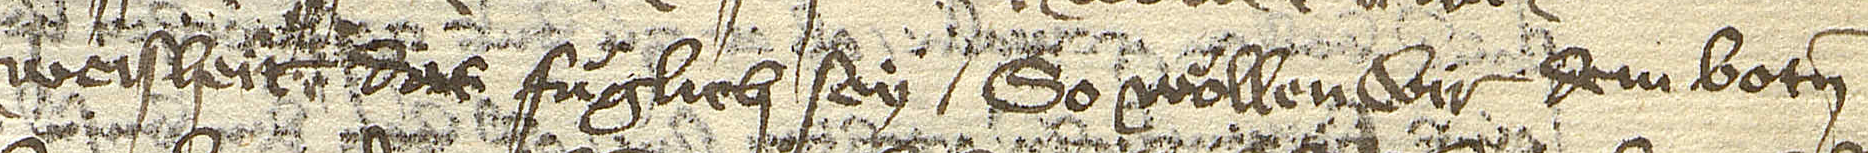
weiſheit das füglich ſey / So wöllen wir dem botn*
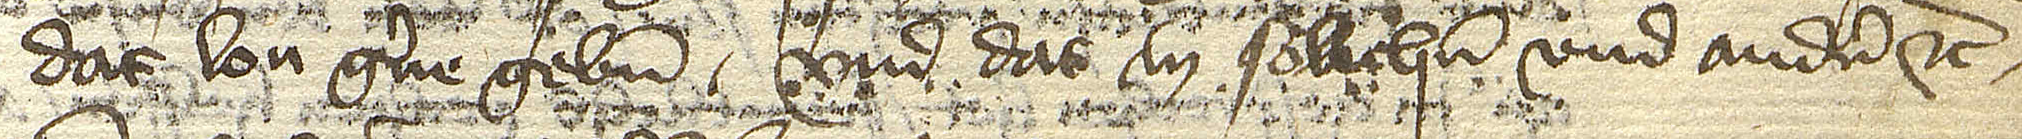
das lon g*ne gebn* / vnd das in ſölichn* vnd andn* ec* /
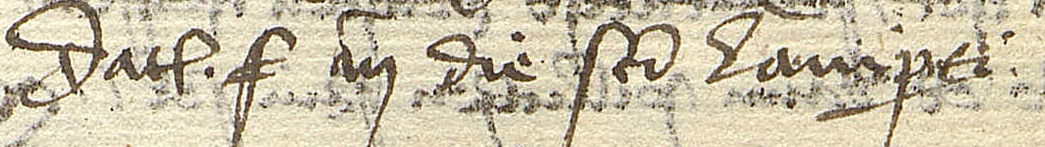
Dat* . ſ in die ſci* Lamp*ti
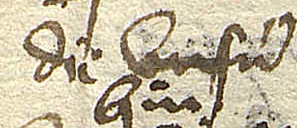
die vnſn*
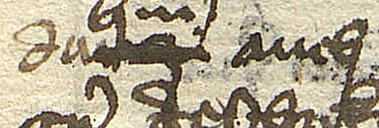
darcʒü auch
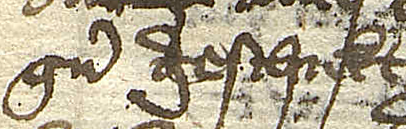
gn* geſchickt
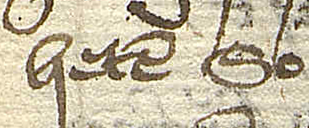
hete* / So
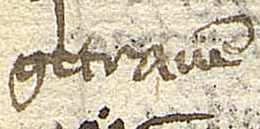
getrawe*
